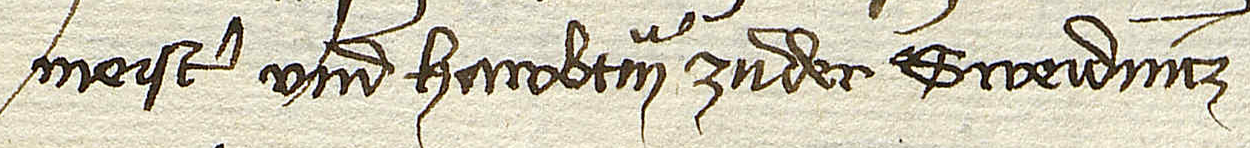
meiſt* vnd hawbt*m ʒu der Sweidnicʒ
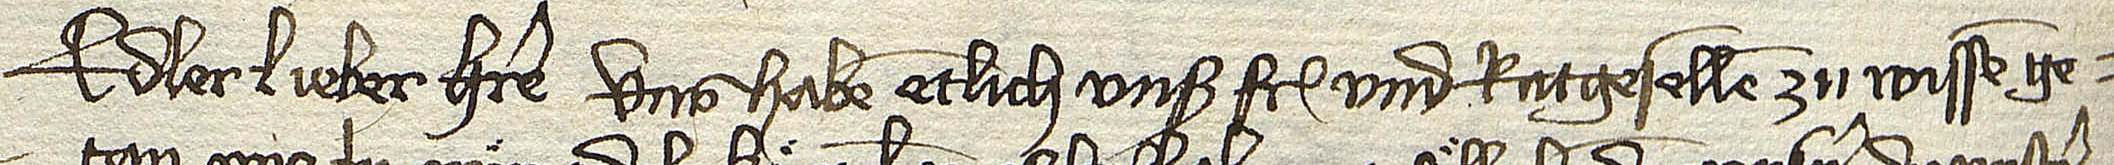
Edler lieber hr*e Vns habe* etlich vnſ* fr* vnd Ratgeſelle* ʒu wiſſe* ge =
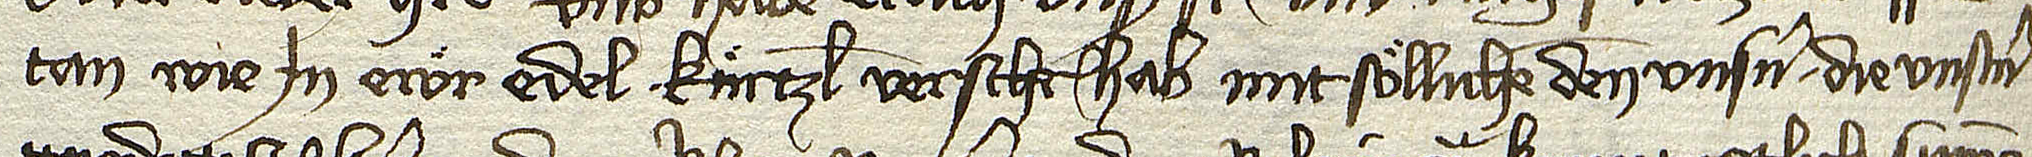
tan wie In eẅr edel . kürcʒl* verſchr* hab mit ſölliche* den vnſ*n . die vnſ*m
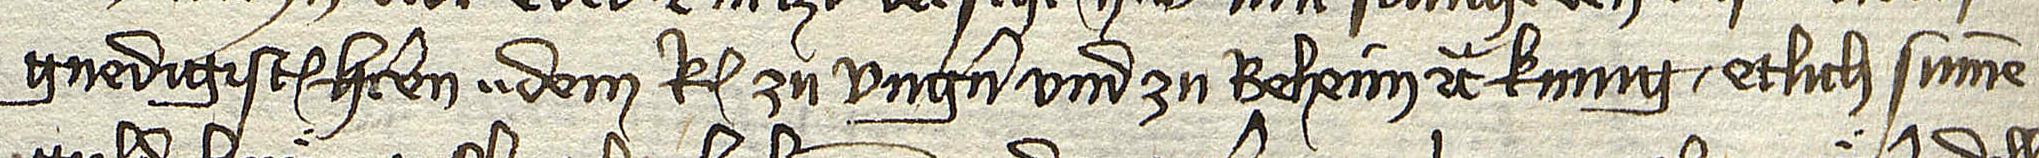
gnedigiſt* h*ren . dem R* ʒu vng*n vnd ʒu Beheim ec* kunig / etlich ſum*e
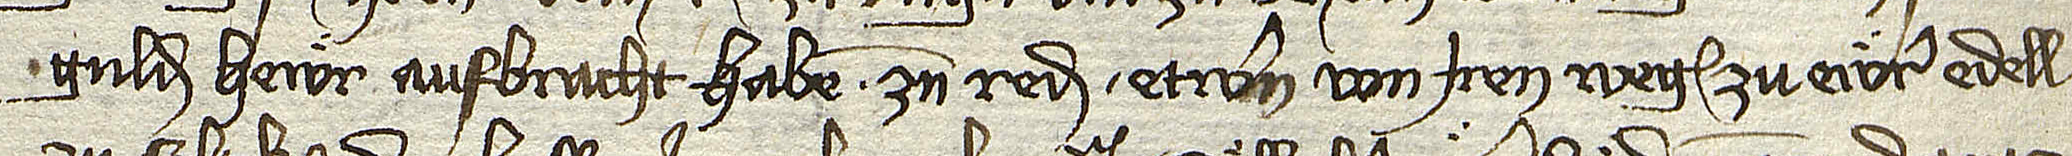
guld* heẅr aufbracht habe* . ʒu red* . etw*n von Iren weg* ʒu eẅr* edell
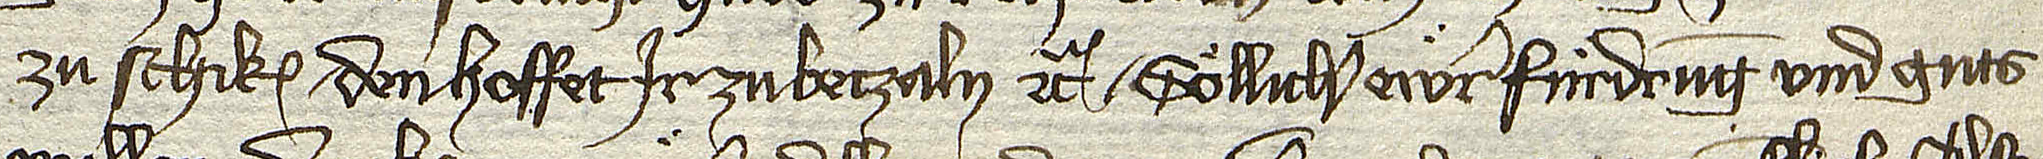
ʒu ſchik* / Den hoffet Ir ʒu becʒaln ec* / Söllich* eẅr fürdru*g vnd guts
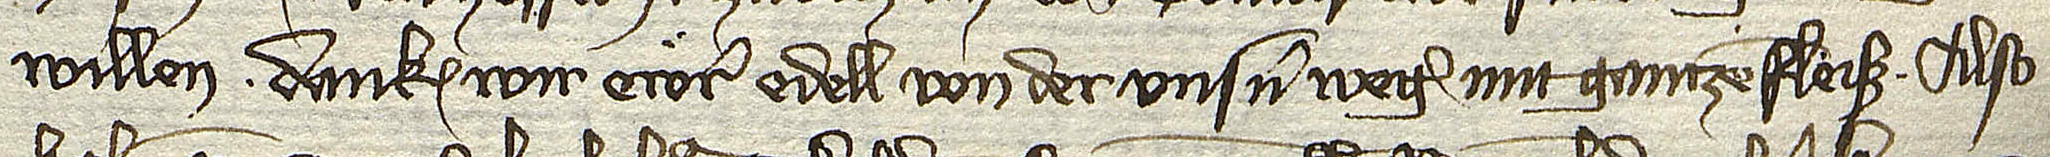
willen . Dank* wir eẅr edell von der vnſ*n weg* mit gancʒe* fleiſʒ . Alſo
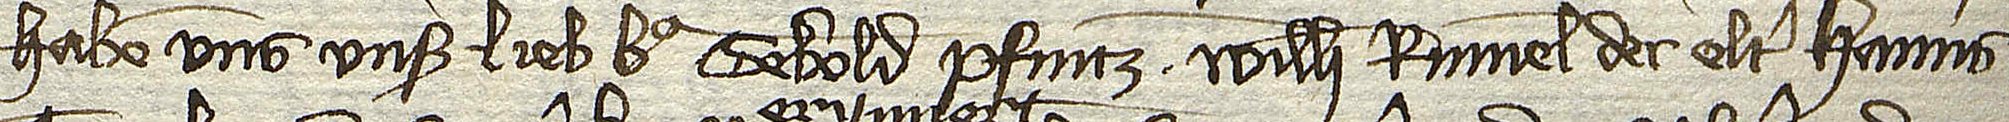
habe* vns vnſ* lieb b* Sebold pfincʒ* . wilh* Rumel* der elt* Hanns
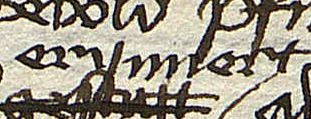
erynnert
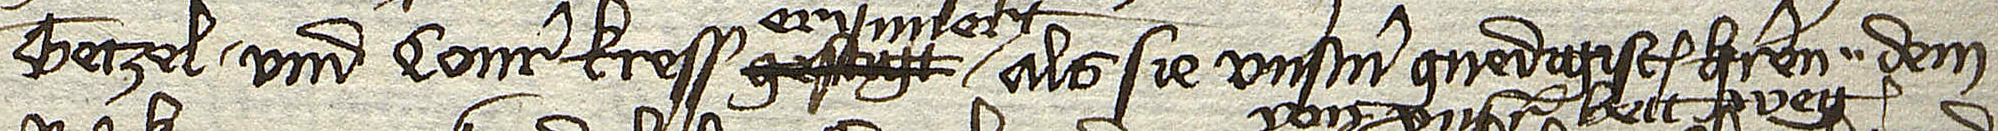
Tecʒel / vnd Conr* Kreſſ geſagt / als ſie vnſ*m gnedigiſt* h*ren ~ dem
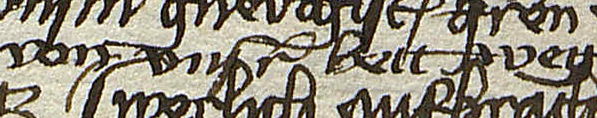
von vnſ*r bett weg*
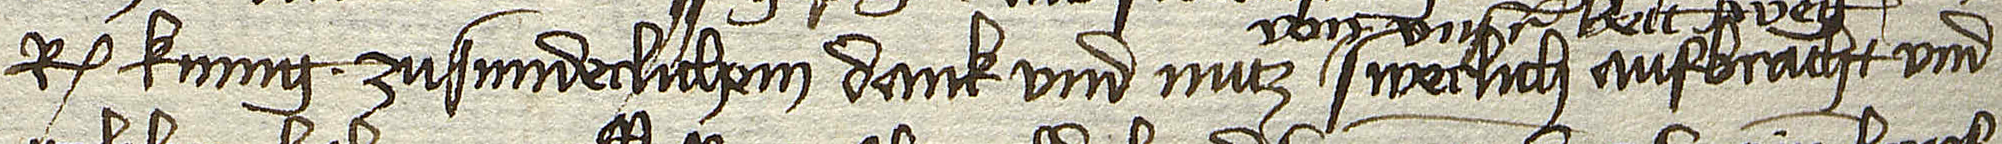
R* kunig . ʒu ſunderlichem dank vnd nucʒ ſwerlich aufbracht vnd
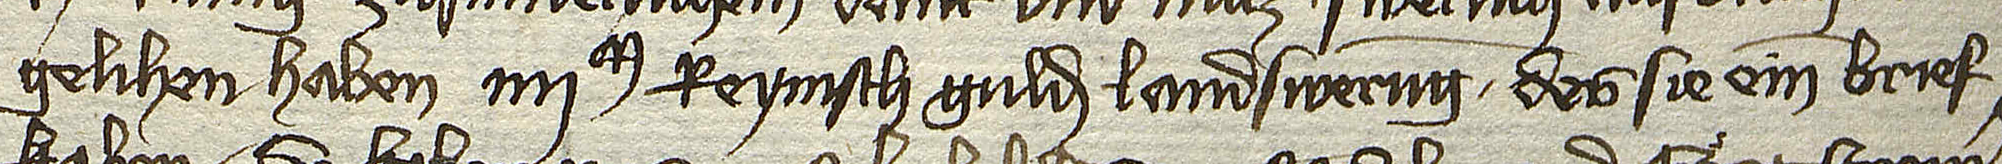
gelihen haben iiii* Reyniſch guld* landſweru*g / des ſie ein* brief
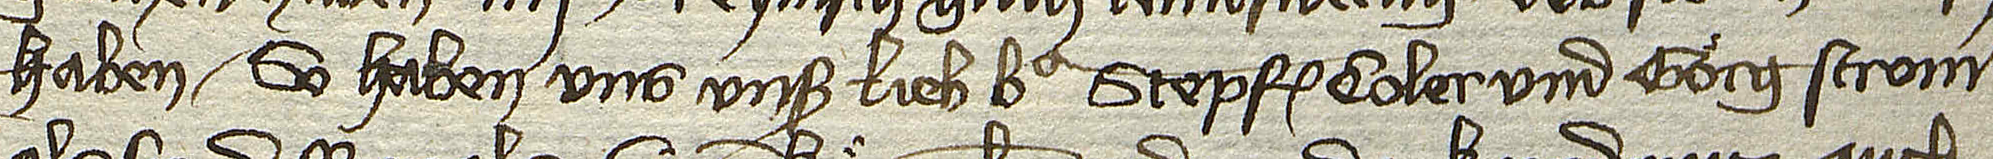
haben / So haben vns vnſ* lieb b* Stepf* Coler vnd Görg ſtrom*
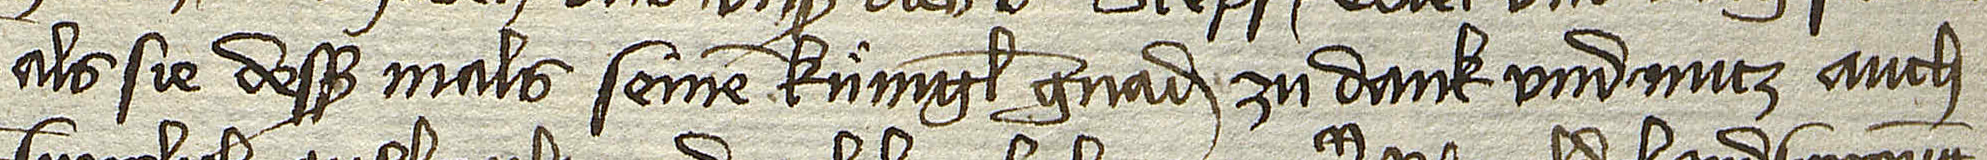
als ſie deſſ* mals ſeine* künigl* gnad* ʒu dank vnd nucʒ auch
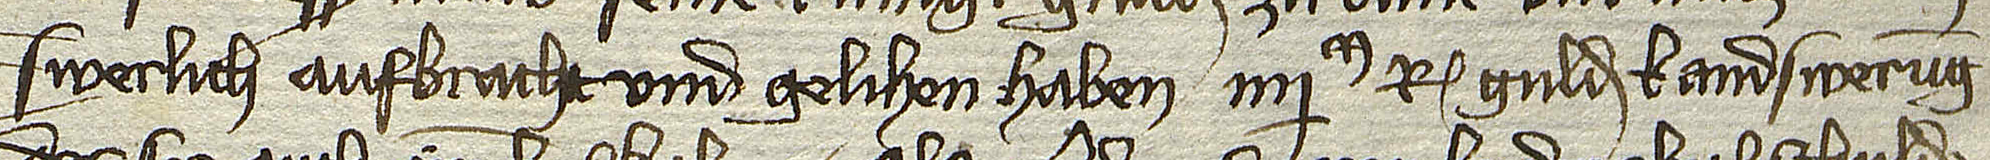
ſwerlich aufbracht vnd gelihen haben iiii* R* guld* landſweru*g
